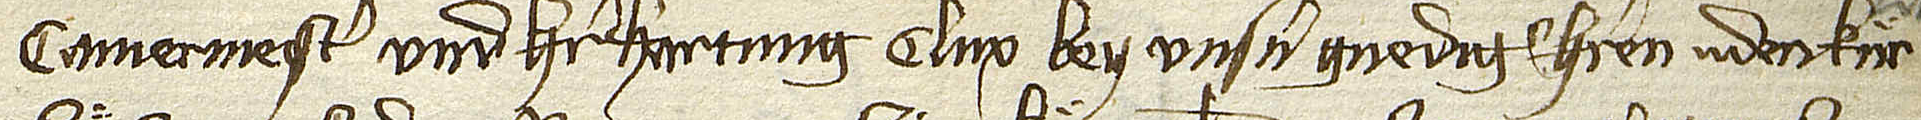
Camermeiſt* vnd h*r Hartung Clux bey vnſ*n gnedig* h*ren ~ den kür -
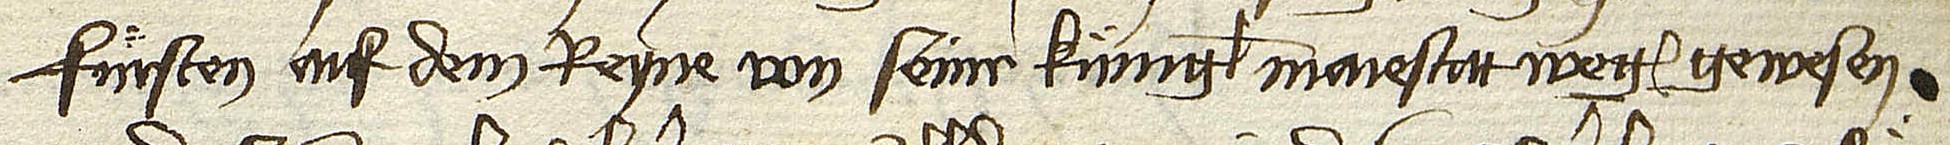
fürſten auf dem Reyne von ſeinr künigl* maieſtat weg* geweſen
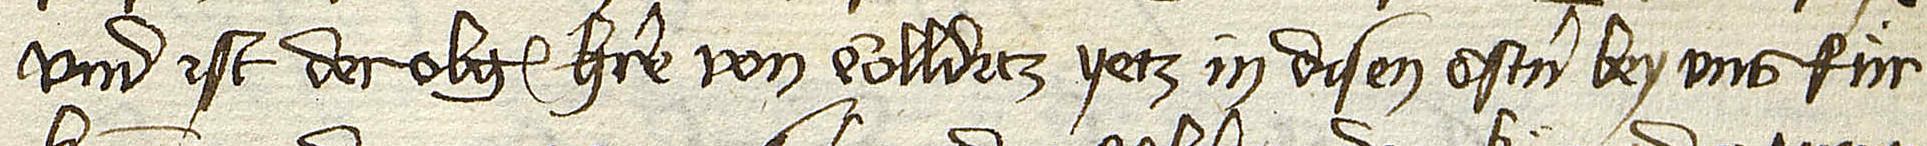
vnd iſt der obg* h*re von Colldicʒ yecʒ in diſen Oſt*n bey vns für
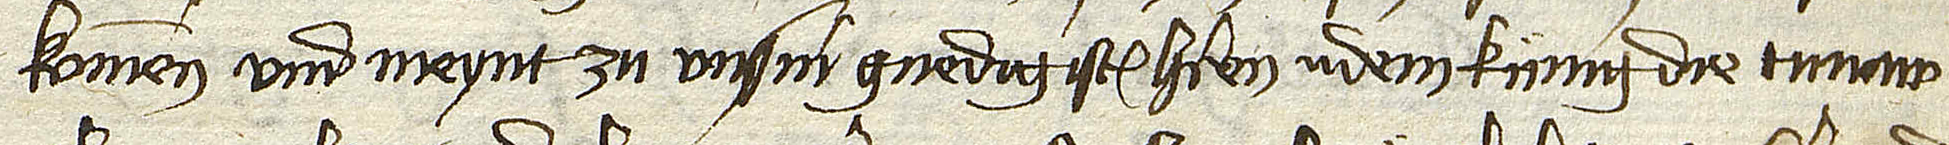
komen* vnd meynt ʒu vnſ*m gnedigiſt* h*ren ~ dem künig die tunaw
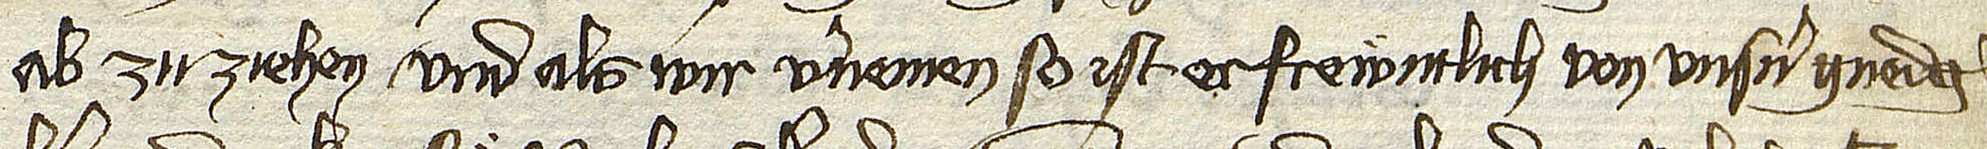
ab ʒu ʒiehen / vnd als wir v*nemen ſo iſt er frewntlich von vnſ*n gnedig*
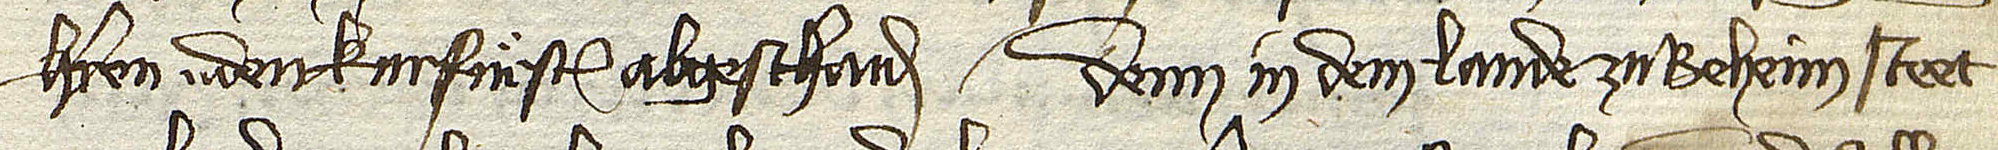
h*ren ~ den kurfürſt* abgeſchaid* / Denn in dem lande ʒu Beheim ſteet
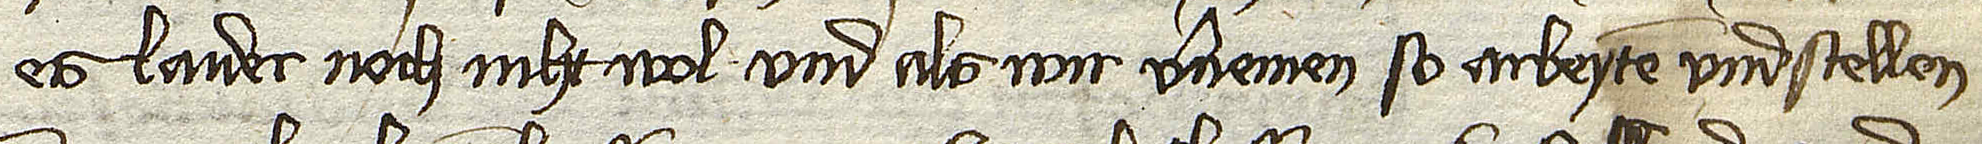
es laider noch niht wol . vnd als wir v*nemen ſo arbeyte* vnd ſtellen
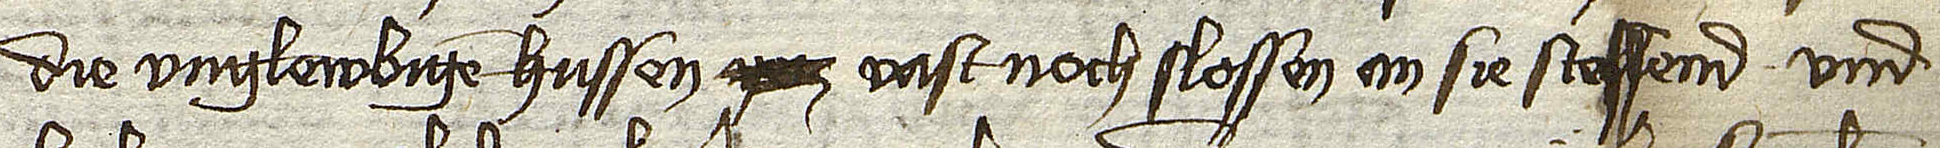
die vnglewbige* huſſen yecʒ vaſt noch ſloſſen an ſie ſteſſend . vnd
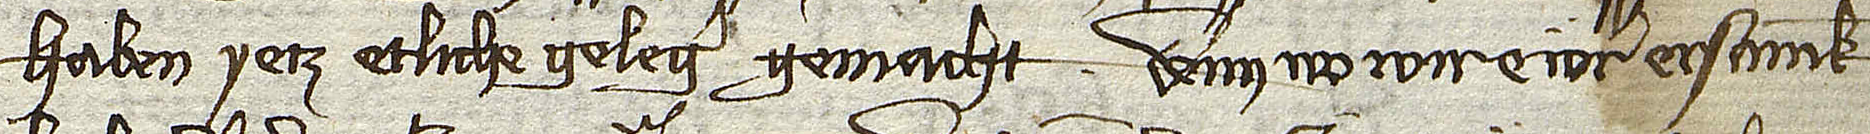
haben yecʒ etliche geleg* gemacht . Denn wo wir ew*r erſamk*
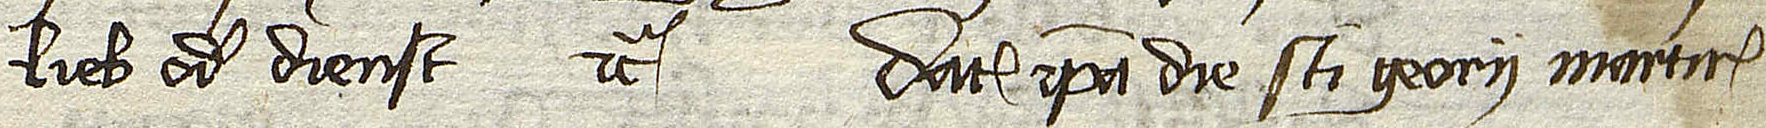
lieb od* dienſt ec* Dat* ipa* die ſci* georii martir*
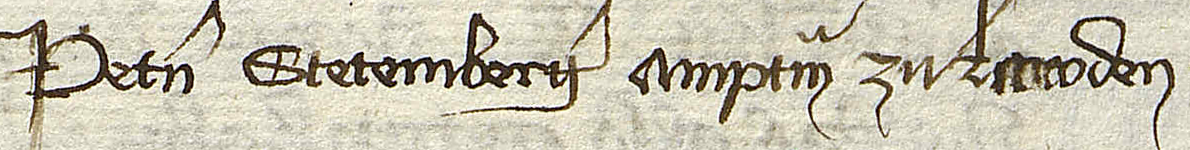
Pet*n Stetemberg* amptm* ʒu Lawden
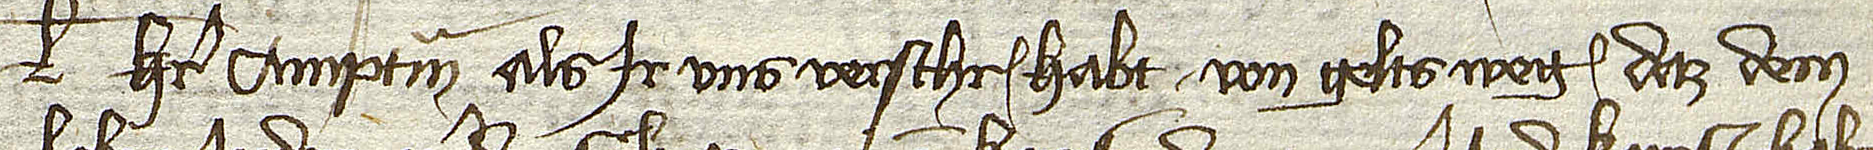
L* H*r Amptm* als Ir vns verſchr* habt / von gelts weg* daʒ dem
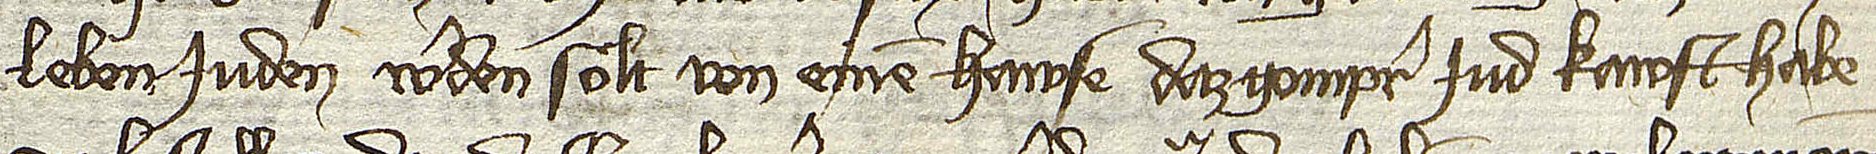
leben Iuden w*den ſölt von eine* hawſe daʒ gompr* Iud kawft habe
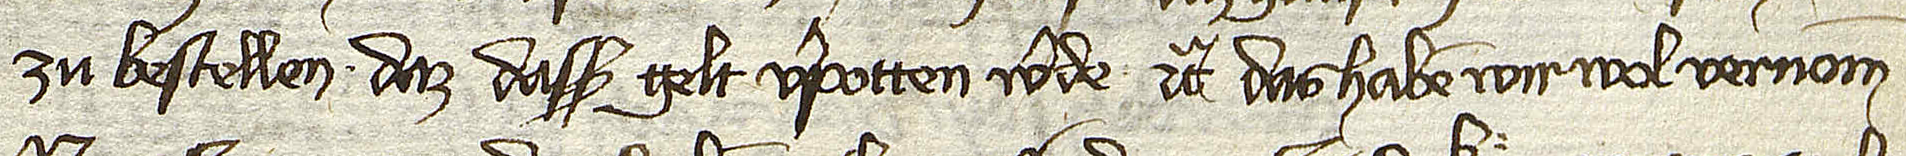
ʒu beſtellen . daʒ daſſ* gelt v*potten w*de : ec* das habe* wir wol vernom*
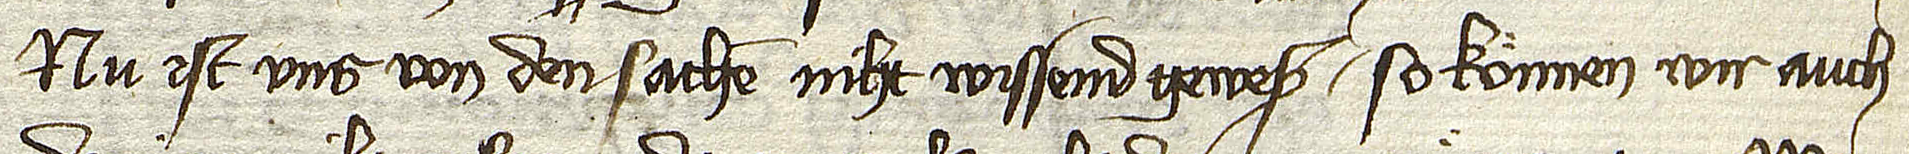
Nu iſt vns von den ſache* niht wiſſend geweſ* / ſo können wir auch
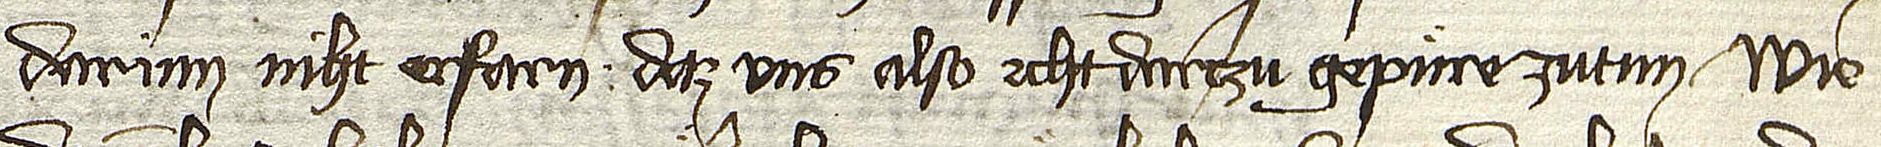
darinn niht erfarn : daʒ vns alſo ich darcʒu gepüre ʒutun / Wie
